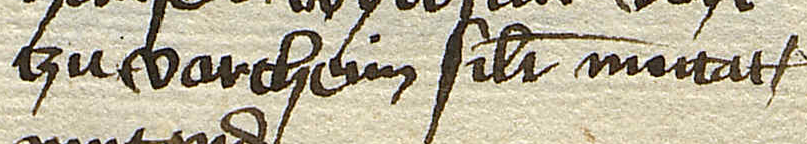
cʒu vorcheim ſilr* mutat*
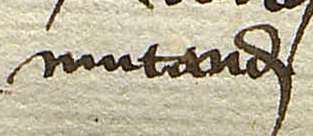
mutand*
